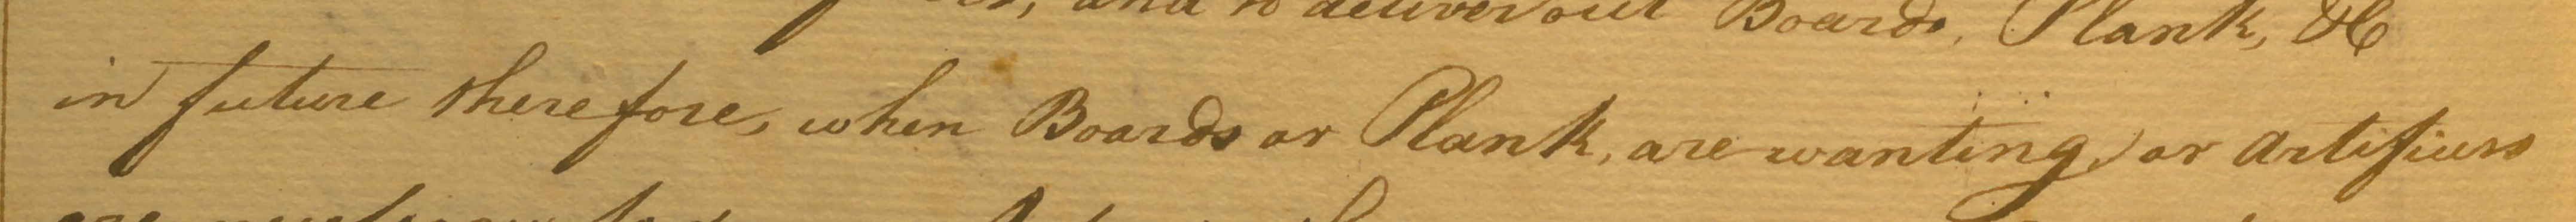in future therefore, when the Boards or Plank are wanting or artificers
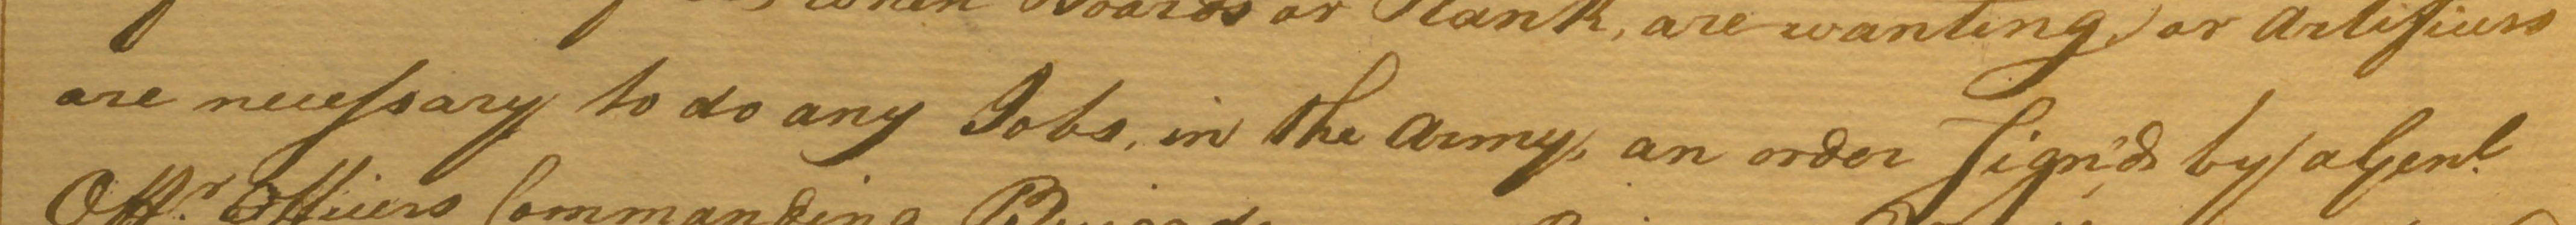are necessary to do any Jobs in the Army, an order sign'd by a Gen^l.
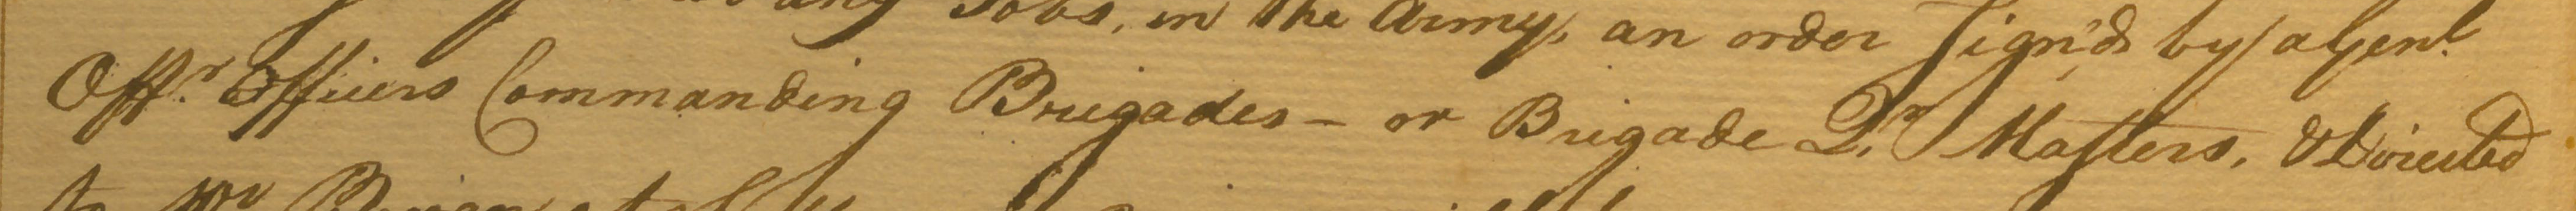Off^r. Officers Commanding Brigades- or Brigade Q^r. Masters, & Directed
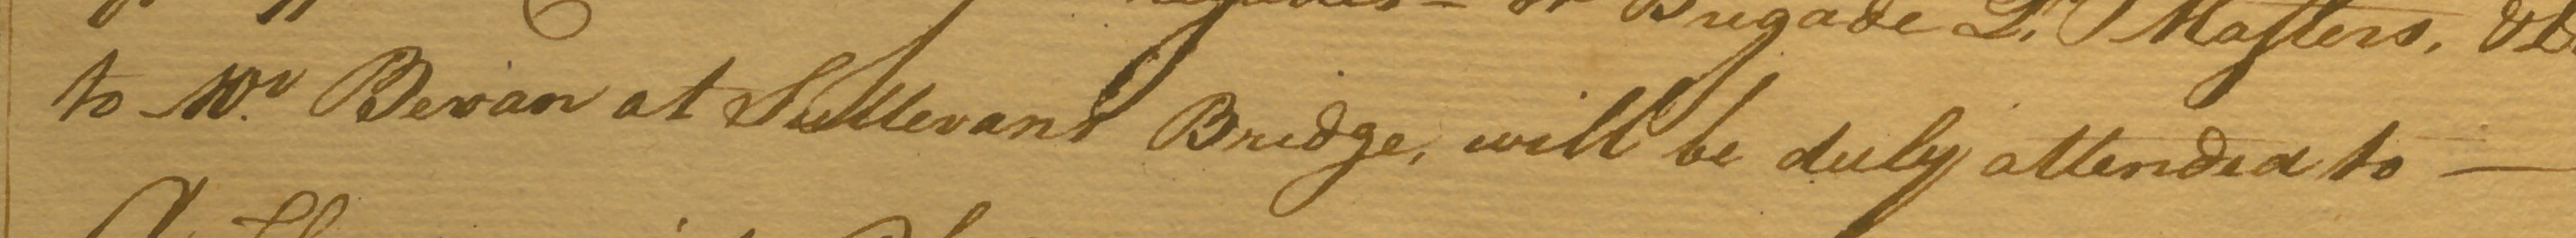to M^r. Bevan at Sullivans Bridge, will be duly attended to-
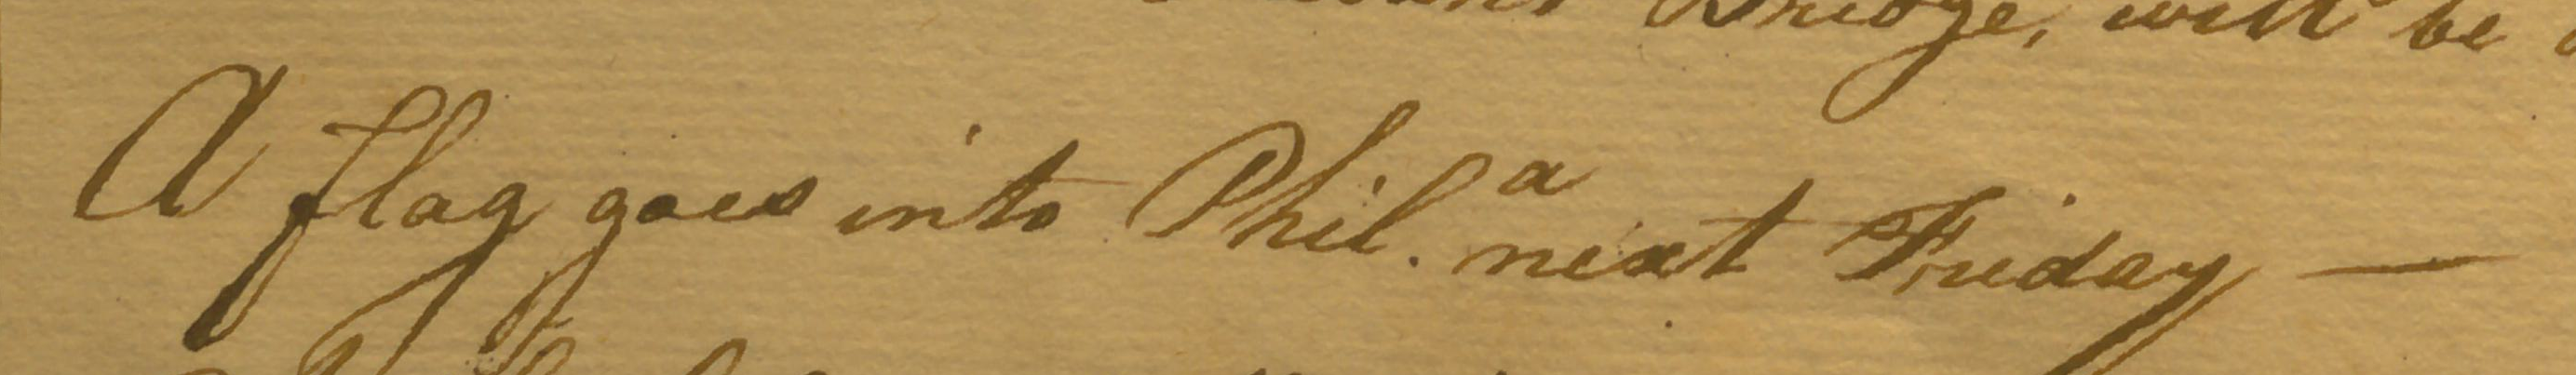A flag goes into Phil^a. next Friday-
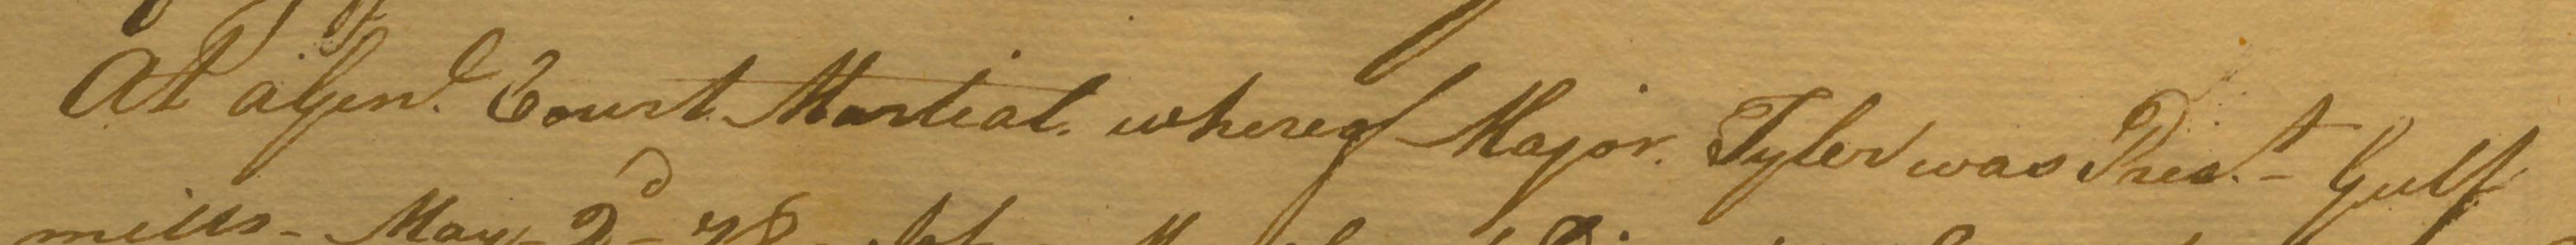At a Gen^l. Court Martial whereof Major Tyler was Pres^t. Gulf
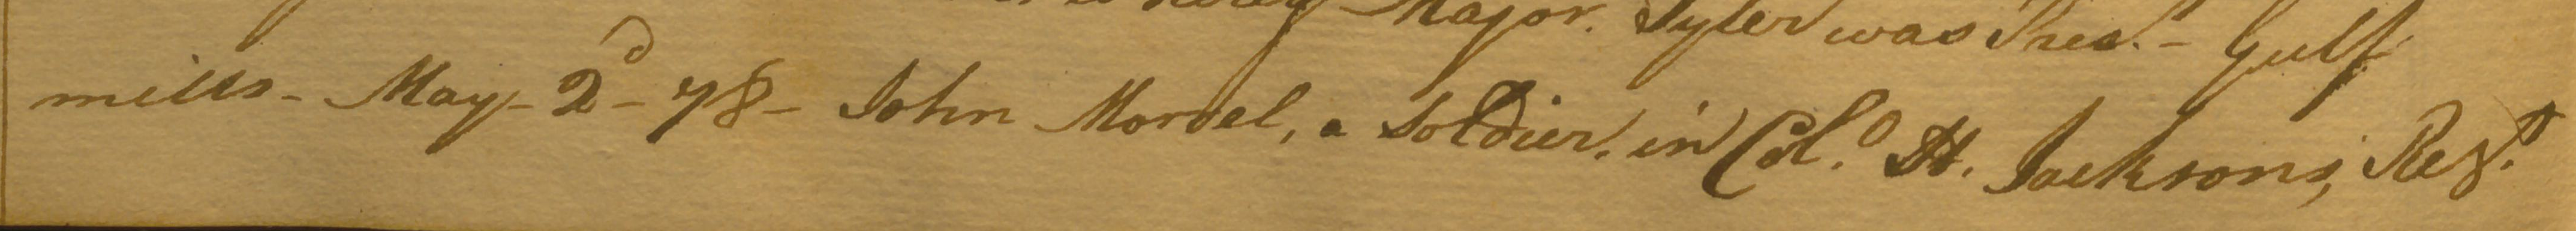mills. May 2^d- 78- John Morrel, a Solder in Col^o. H. Jackson's Reg^t.
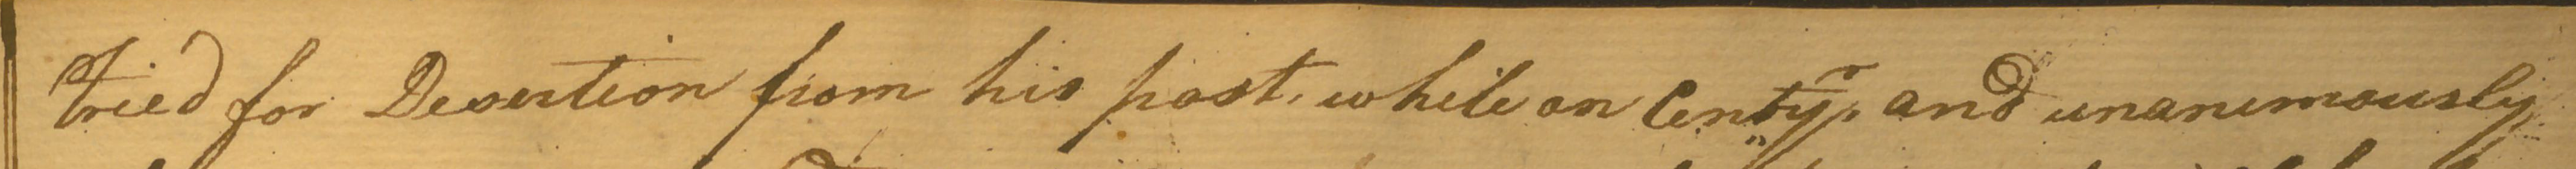Tried for Desertion from his post while on Cent^ry, and unanimously
